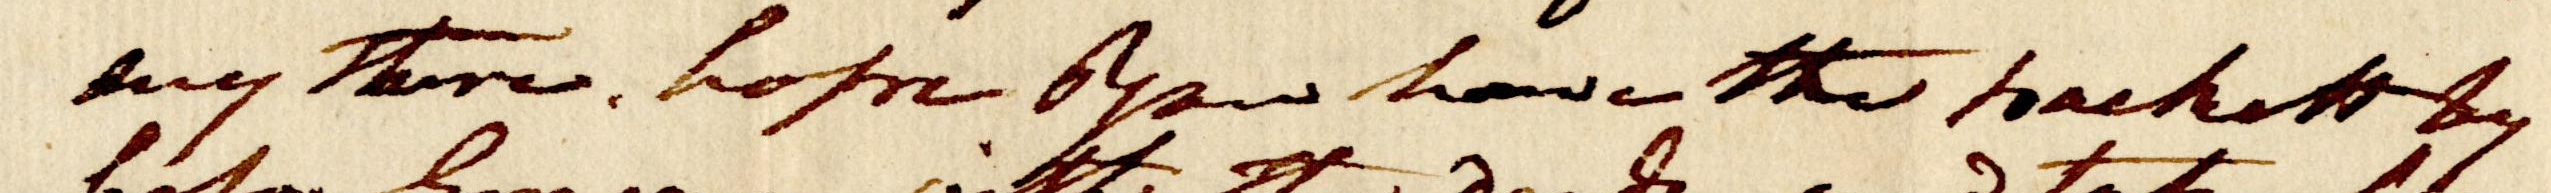any there hope you have the packett by
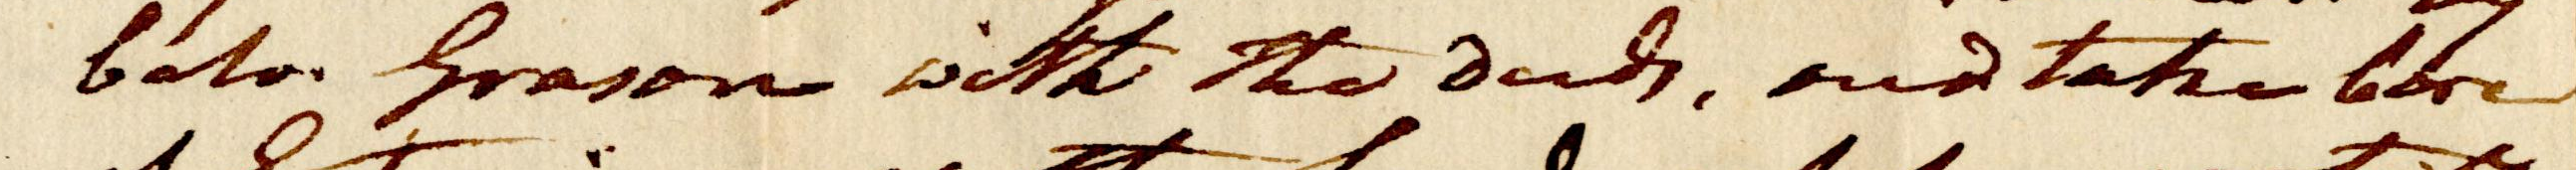Colo. Grason with the deeds, and take Care
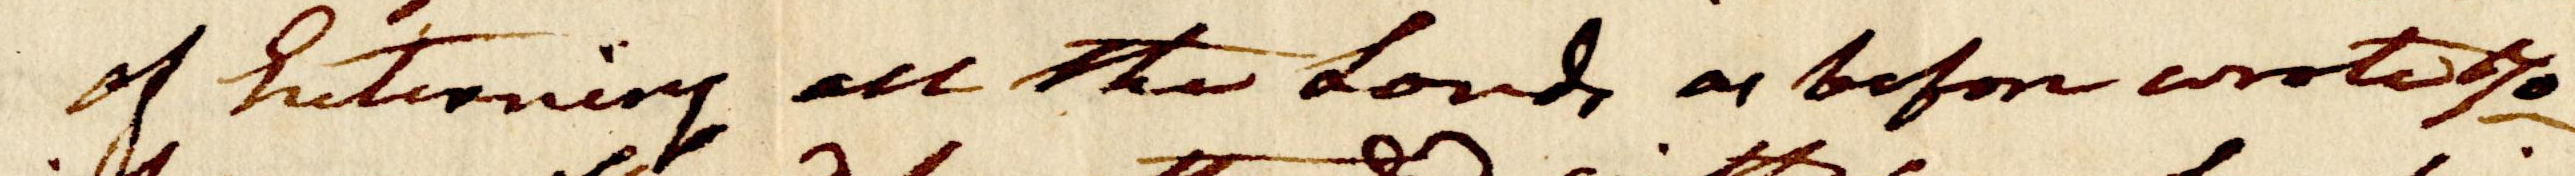of returning all the Lands as before wrote you
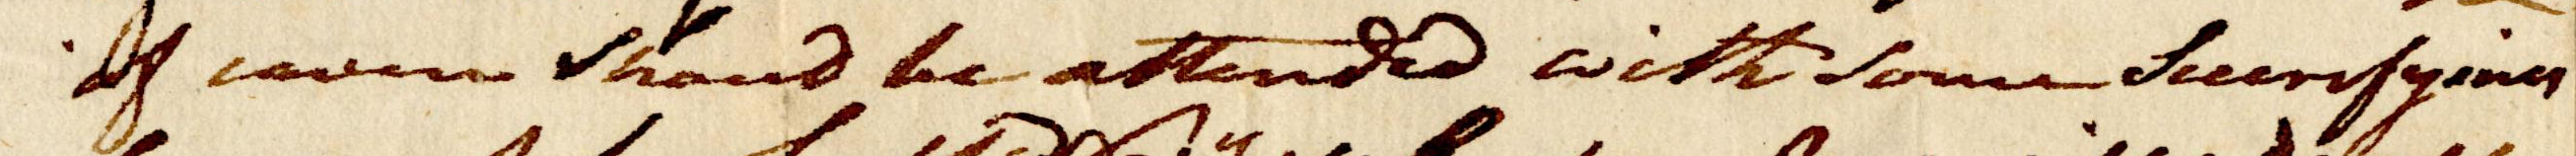If care shoud be attended with Some sceerfying
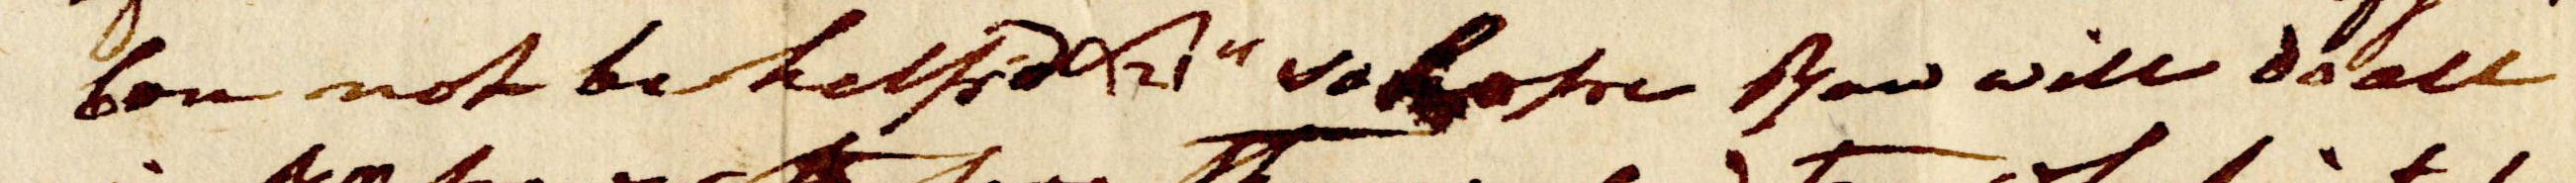can not be kept & 21^u so before you will do all
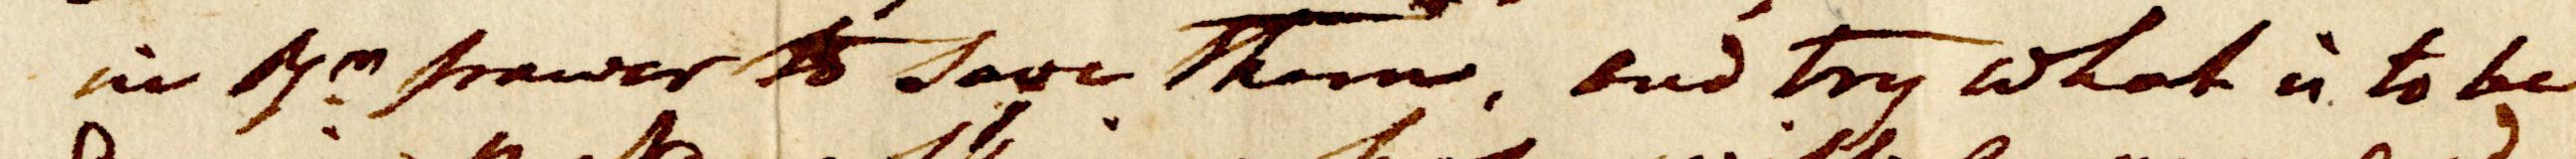in y^r power to Save them, had try what is to be
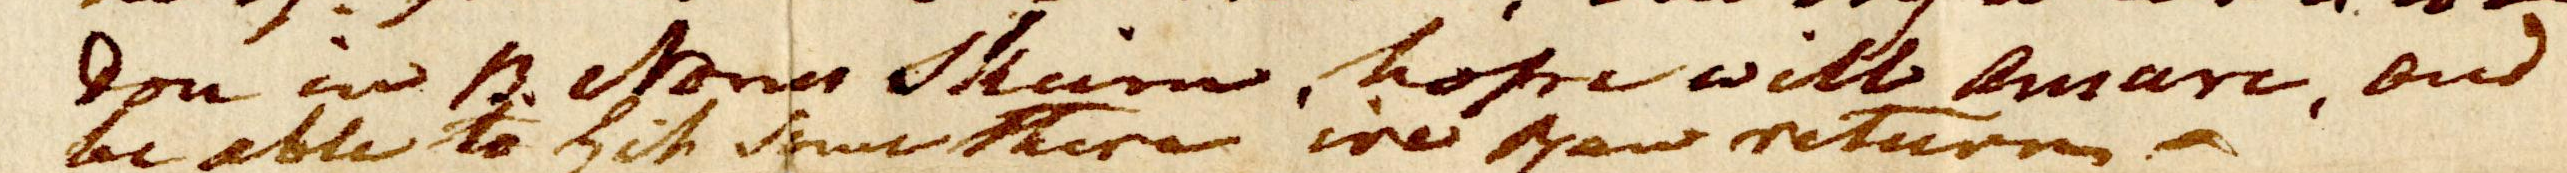dib in B from silver hope will answer, and
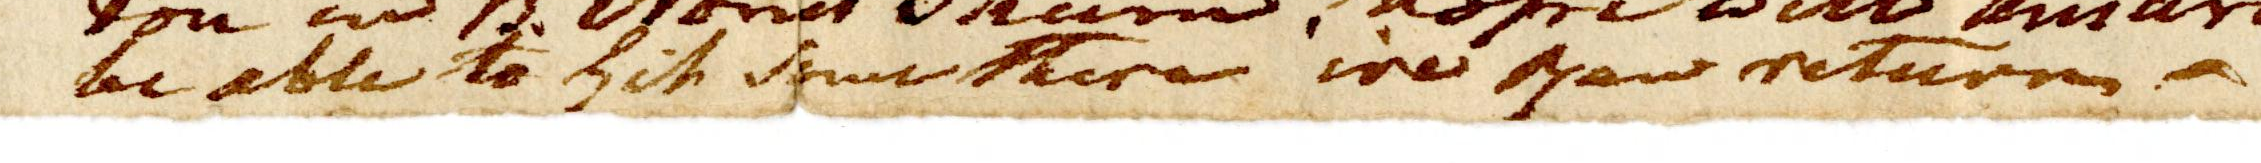be able to Git from there in your rerurns.-
